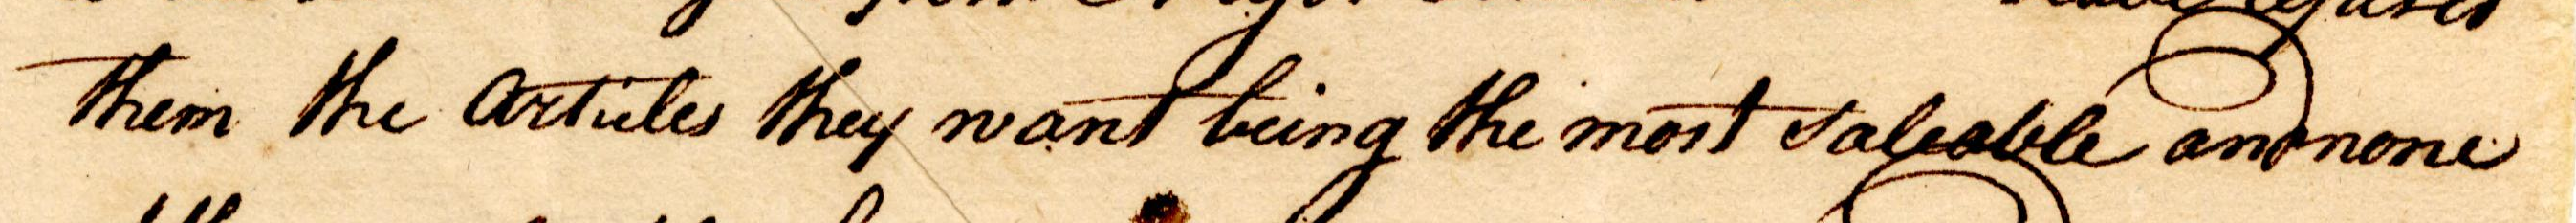them the articles they want being the most saleable and none
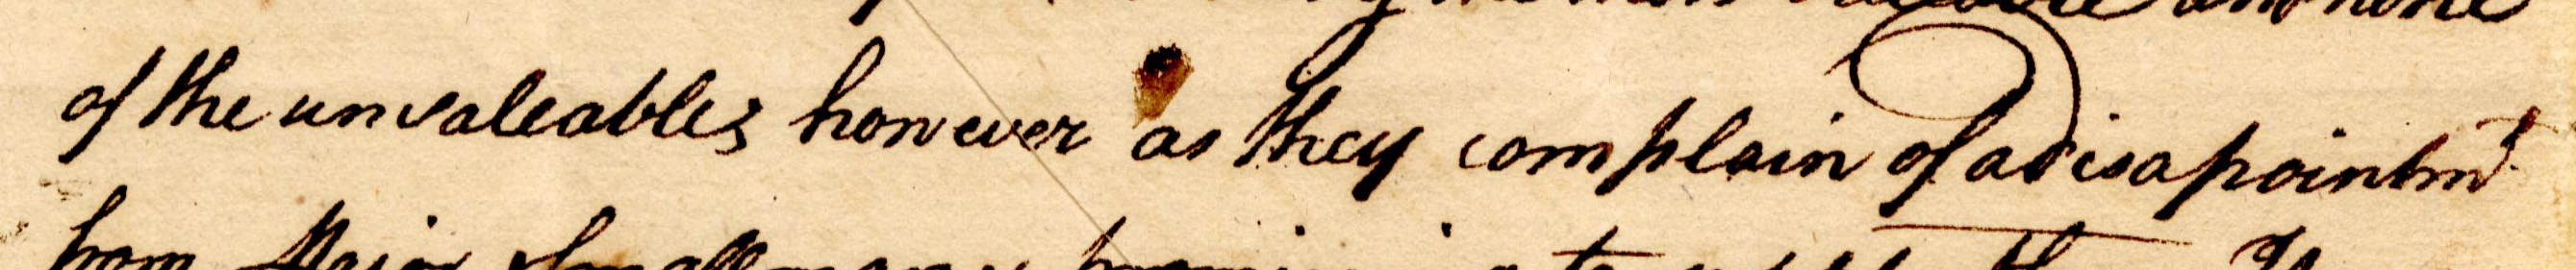of the unvaluables however as they complain of a disapointm^t
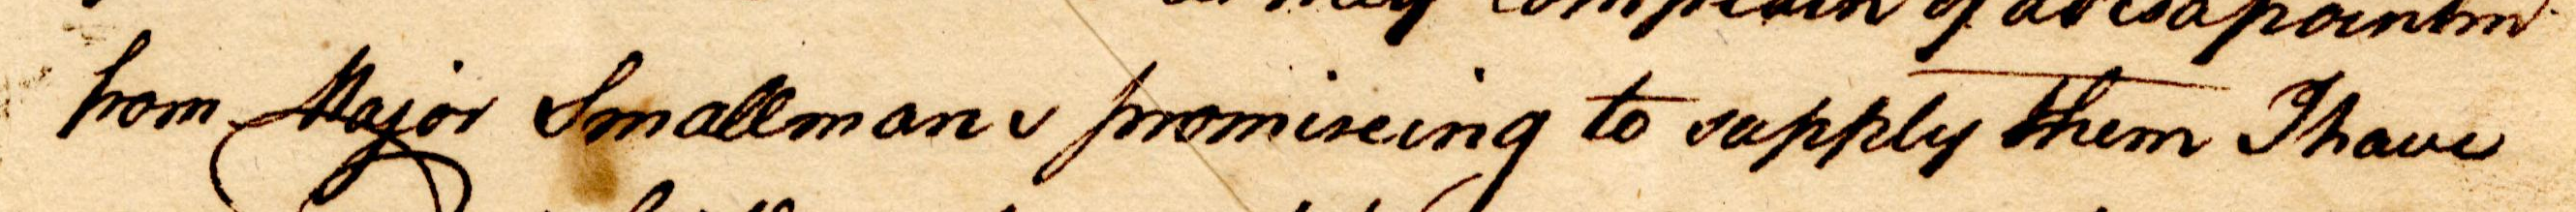from Major Smallman from isuing to supply them I have
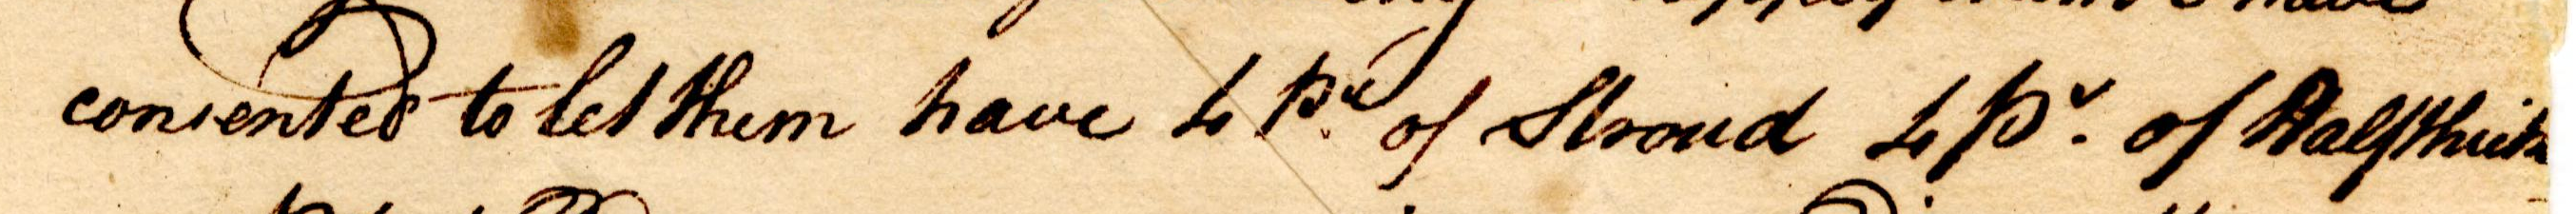consented to let them have 4p of Stroud 4p. of Halfthik
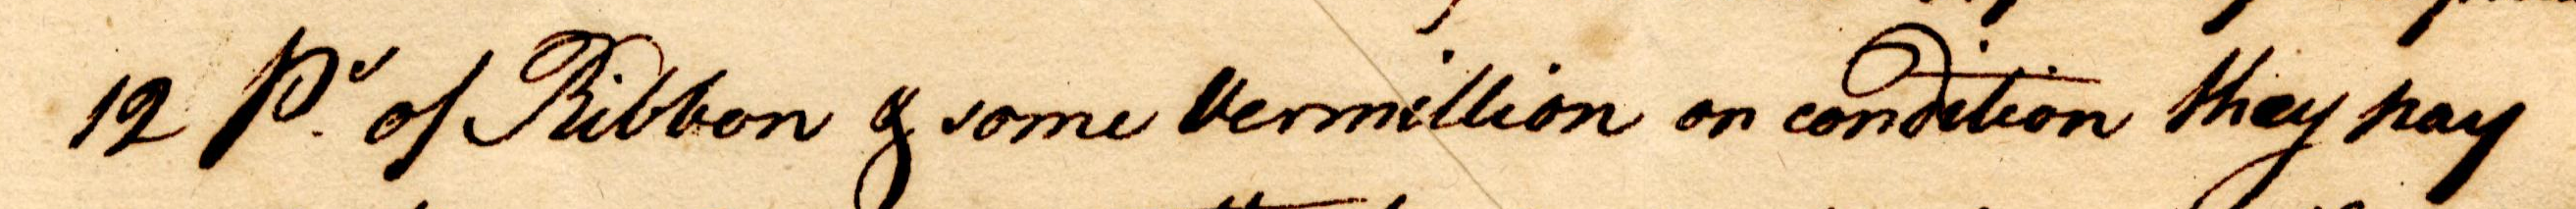12 p^s. of Ribbon and some vermillion on condition they pay
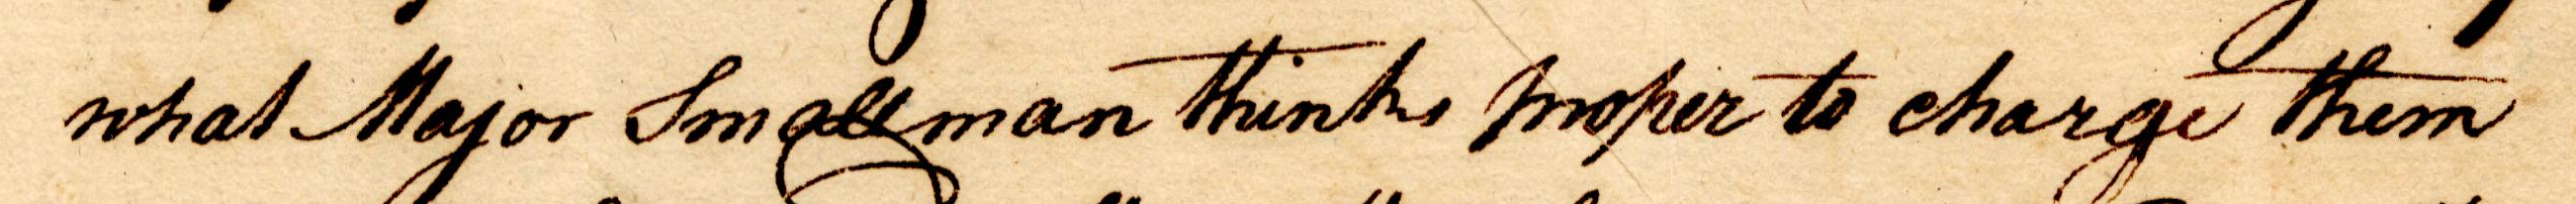what Major Smallman thinks proper to charge them
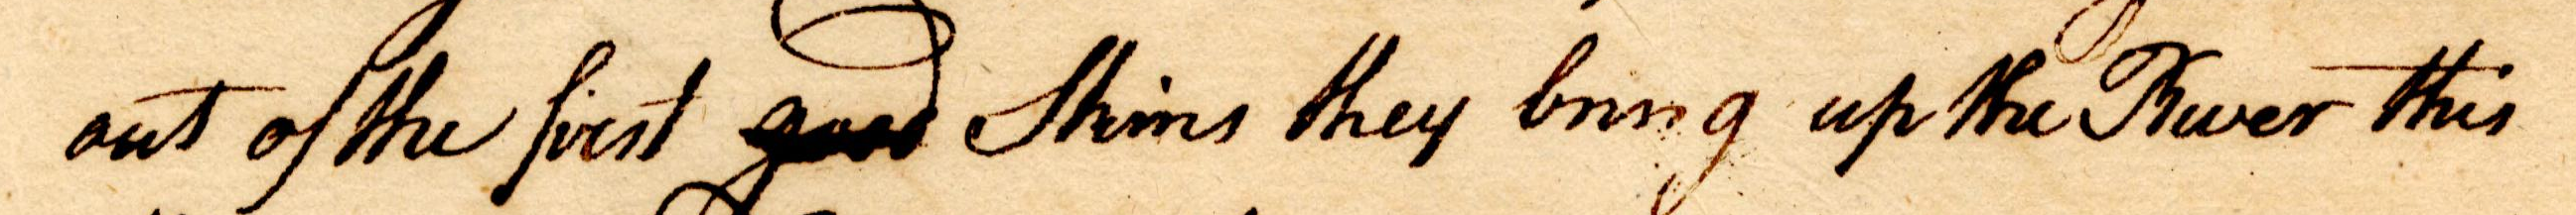and of the [good] skins they bring up the River this
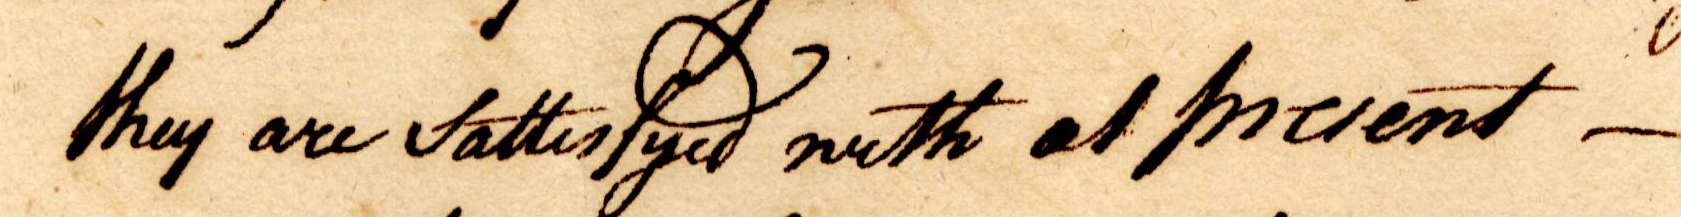they are sattisfyed with at present
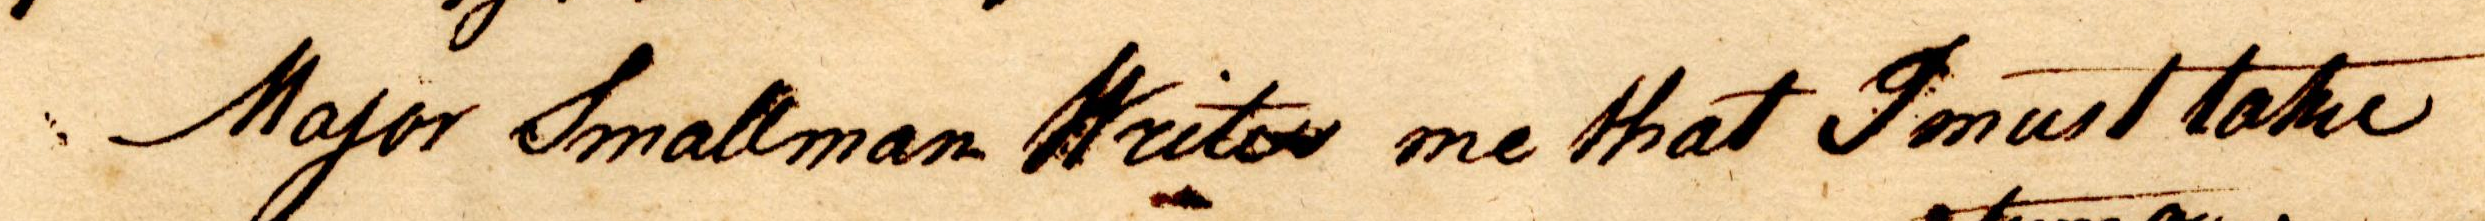Major Smallman Writes me that I must take
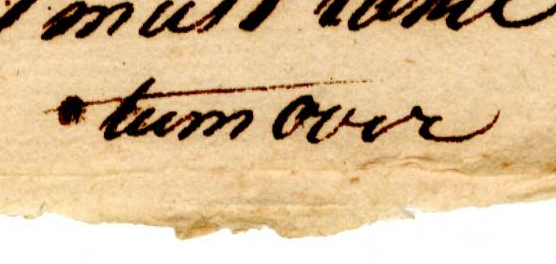turn over
